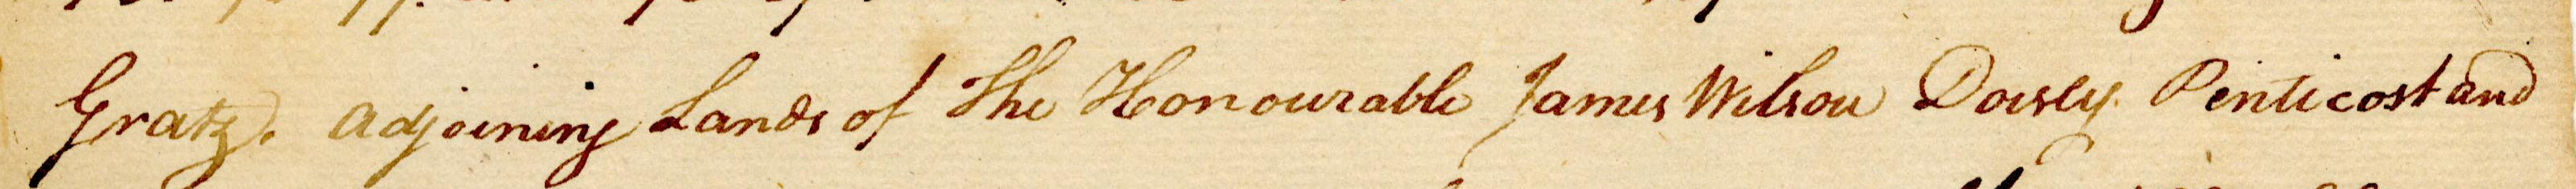Gratz. adjoining Lands of The Honourable James Wilson Darcy Penticost and
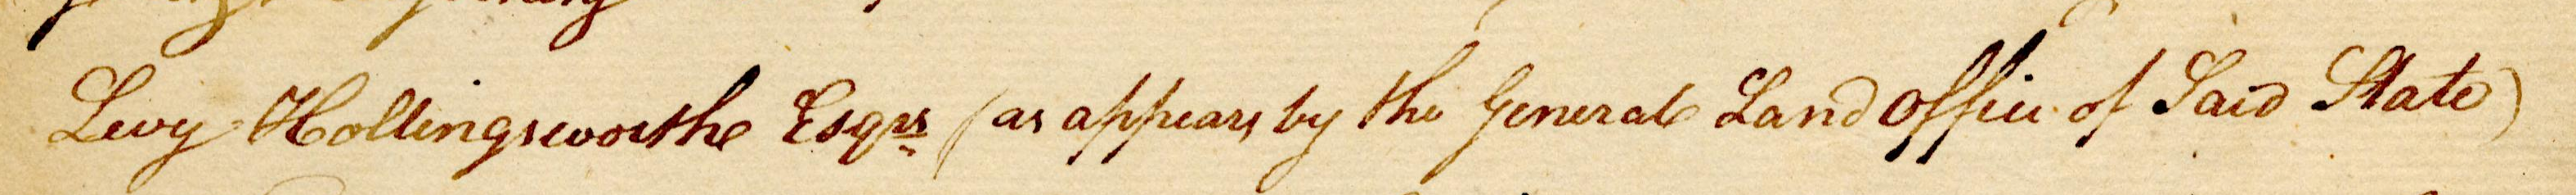Levy Hollingsworth Esq^rs (as appears by the General Land Office of Said State)
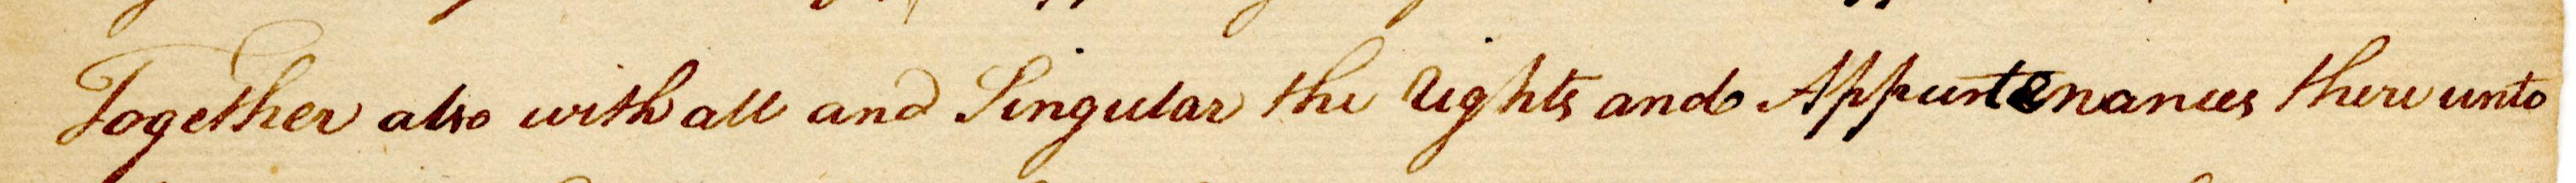Together also with all and singular the rights and Appurtenances there unto
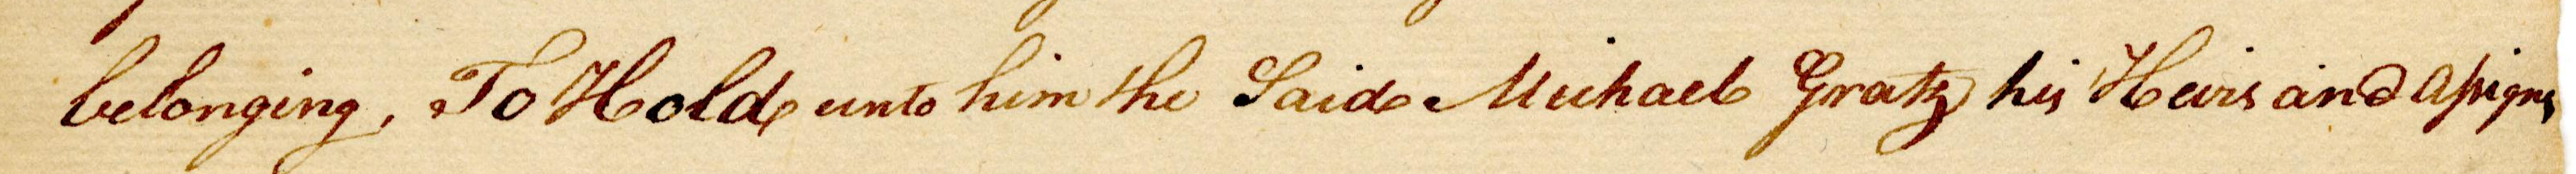belonging, To Hold unto him the said Michael Gratz his Heirs and assigns
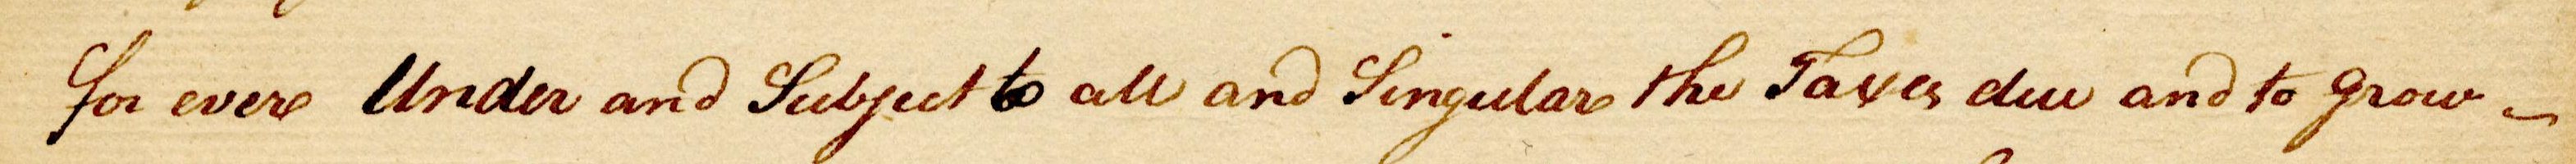for ever Under and Subject to all and Singular the Taxes due and to grow-
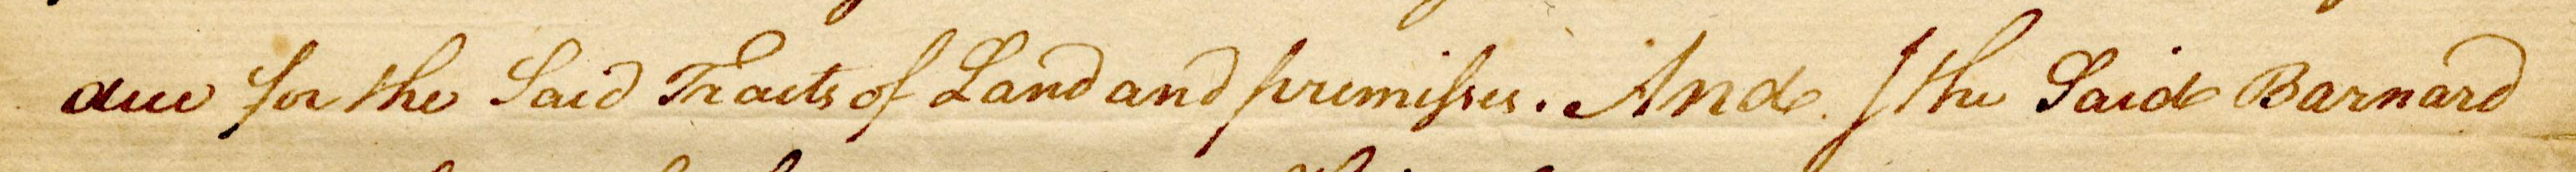due for the said Tracts of Land and premises And I the said Barnard
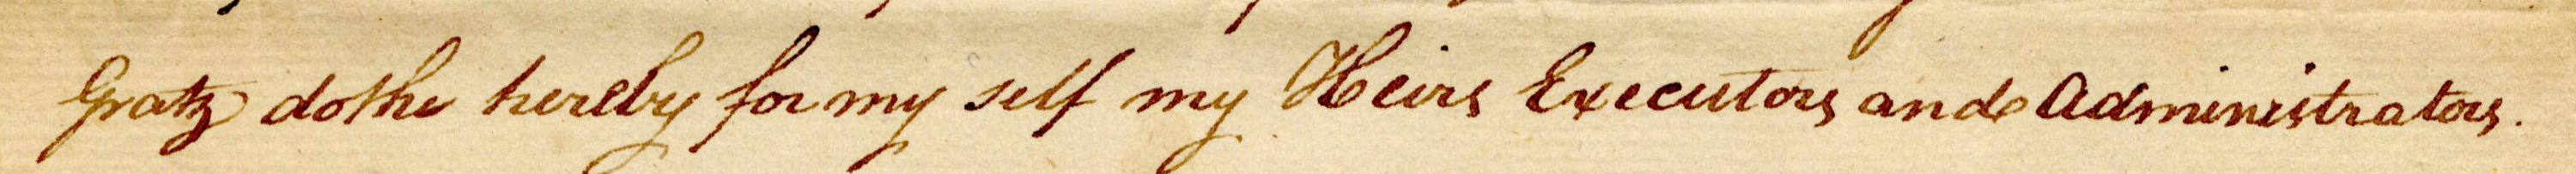Gratz do the hereby for my self my Heirs Executors and Administrators.
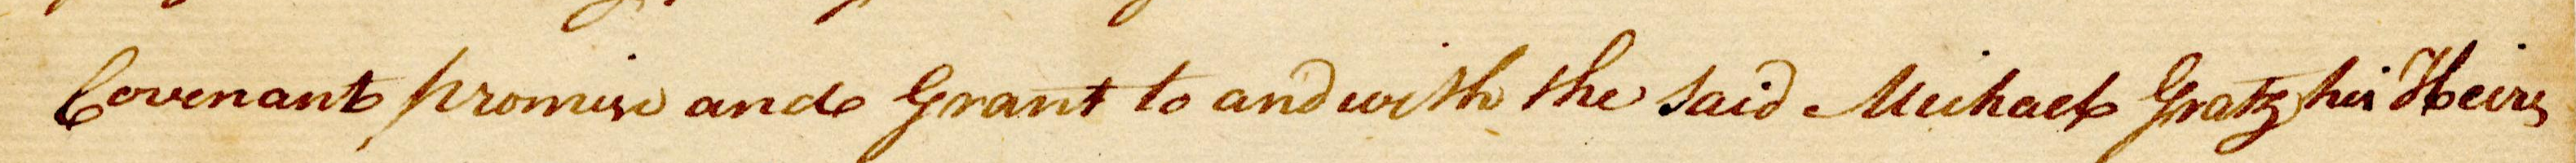Covenant promise and Grant to and with the said Michael Gratz his Heirs
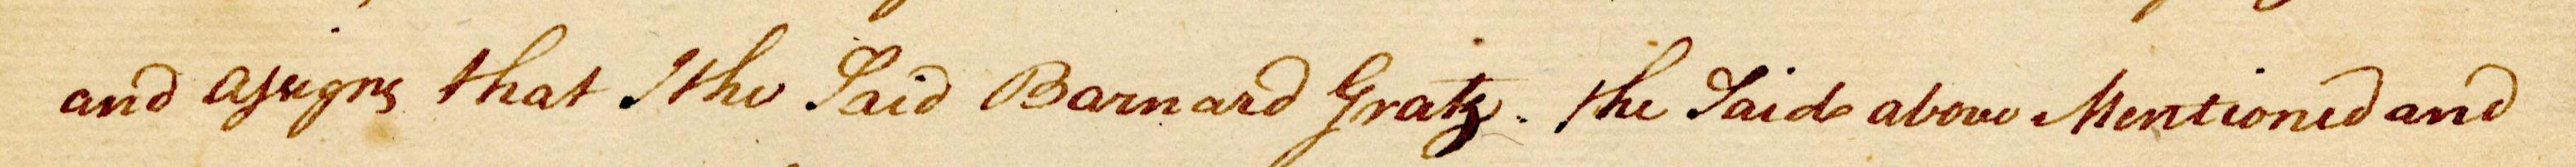and assigns that I the Said Barnard Gratz the said above Mentioned and
